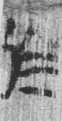於
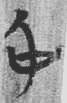身
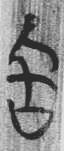旨（稽）
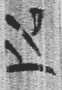之
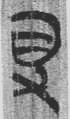𠭁（得）
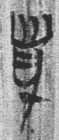{鼠一}（一）
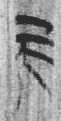天,而
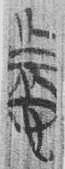𢝬（圖）
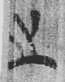之
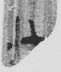○（如）
